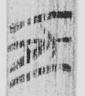亙（恆）
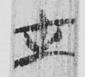才（災）
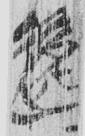後
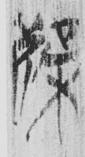殜（世）
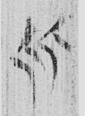比
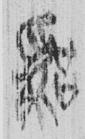○（亂）
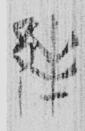邦
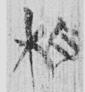相
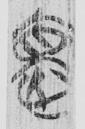懷
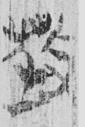毀
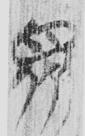眾
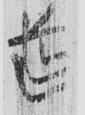必
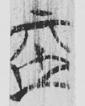亞（惡）
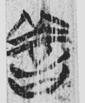善
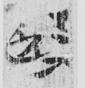○（賢）
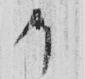人
